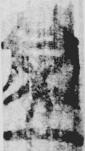堂（當）
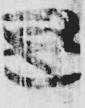是
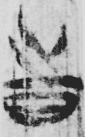○（時）
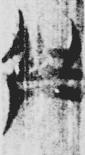強
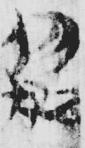溺（弱）
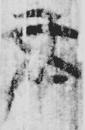不
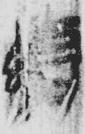○（治）
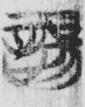諹
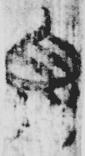衆
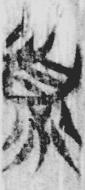○（寡）
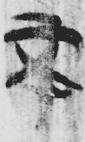不
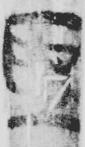聖（聽）
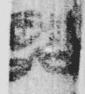訟
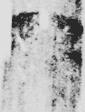天
